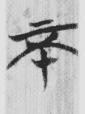不
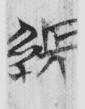張
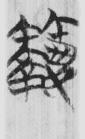{竹執}
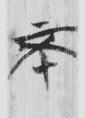不
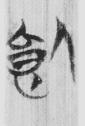飤
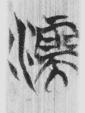濡
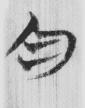肉
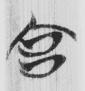宮
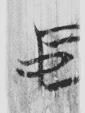𠁩
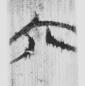六
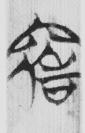{穴人告}
